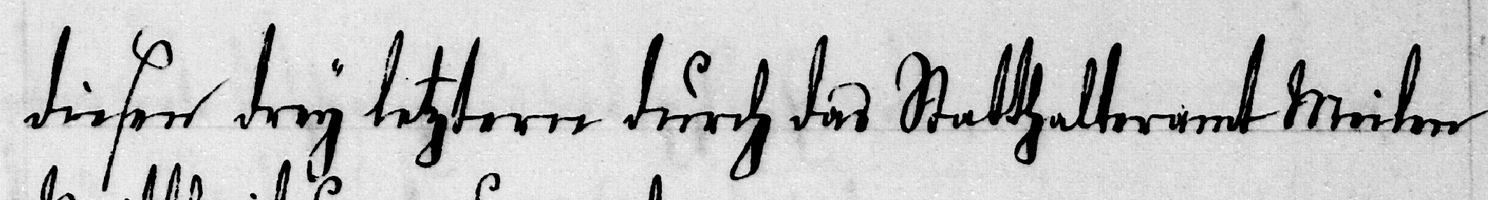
diesen drey letztern durch das Statthalteramt Meilen
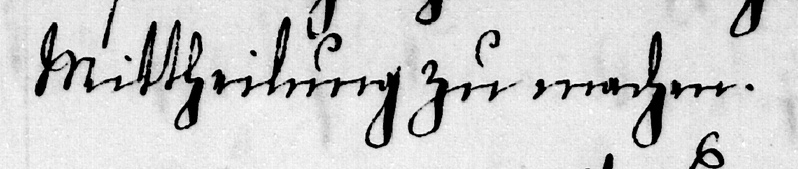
Mittheilung zu machen.
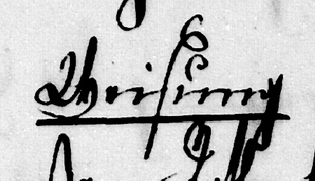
Weisung
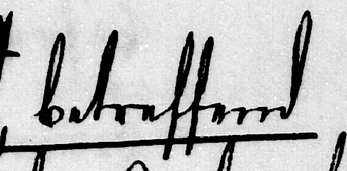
betreffend
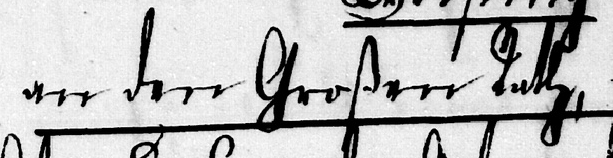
an den Großen Rath,
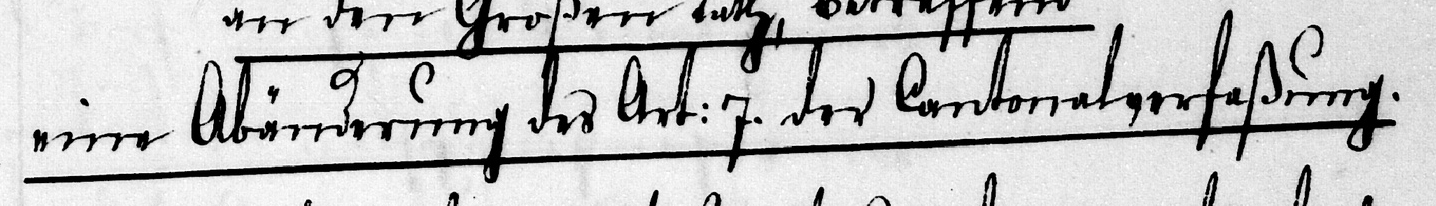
eine Abänderung des Art: 7. der Cantonalverfaßung.
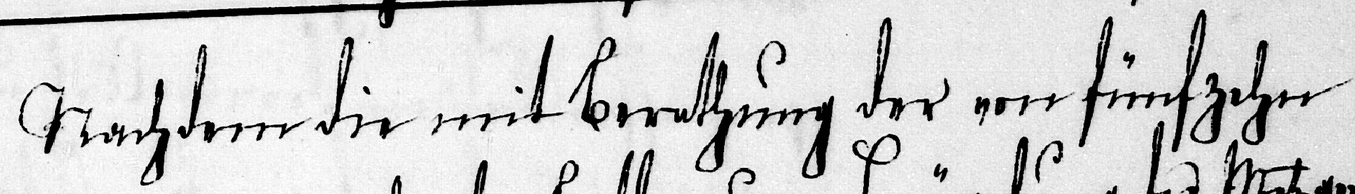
Nachdem die mit Berathung der von fünfzehn
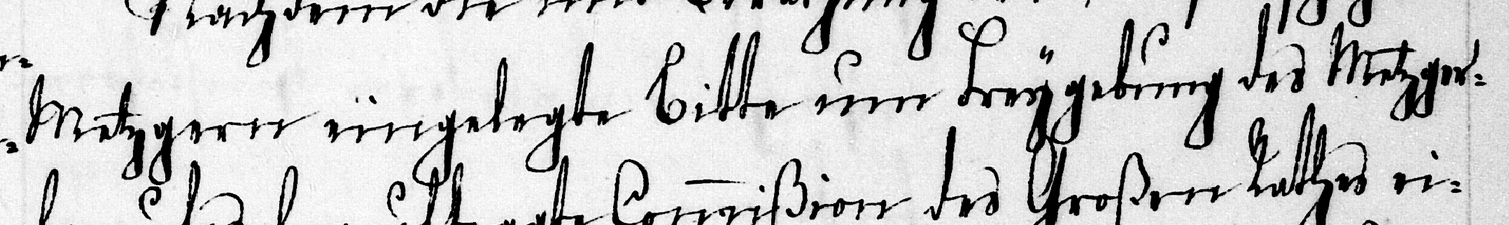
Metzgern eingelegte Bitte um Freygebung des Metzger¬
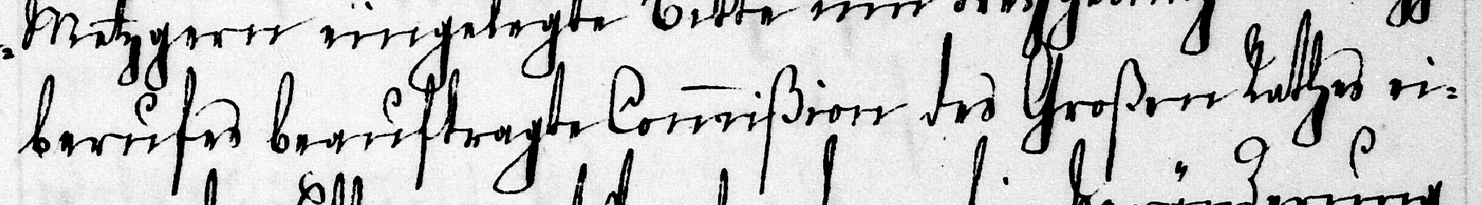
berufes beauftragte Commißion des Großen Rathes ei¬
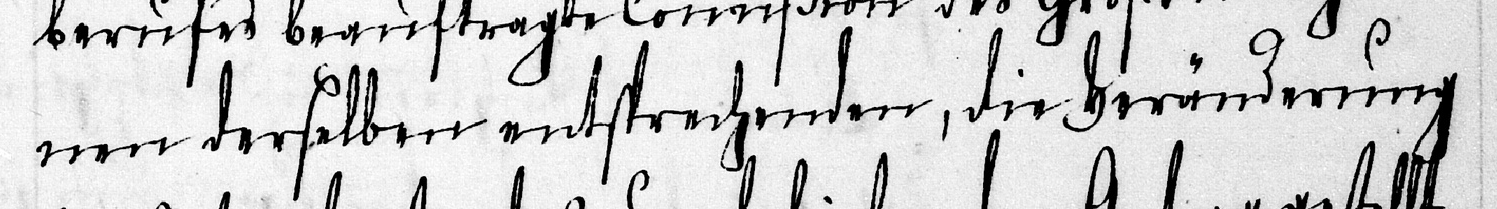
nen derselben entsprechenden, die Veränderung
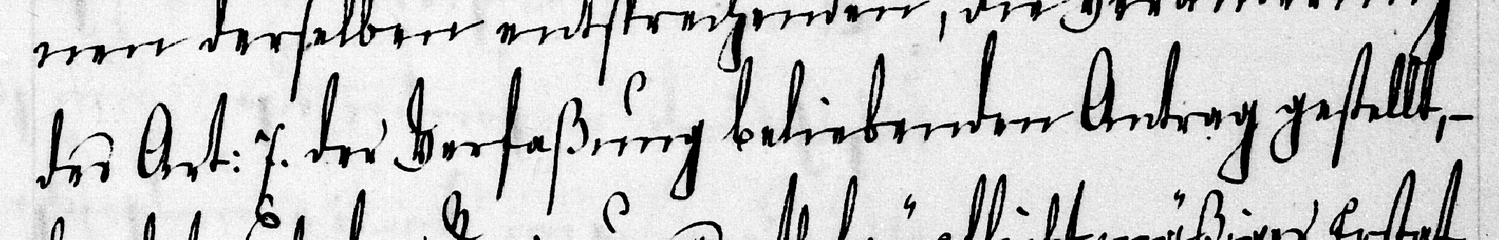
des Art: 7. der Verfaßung beliebenden Antrag gestellt,
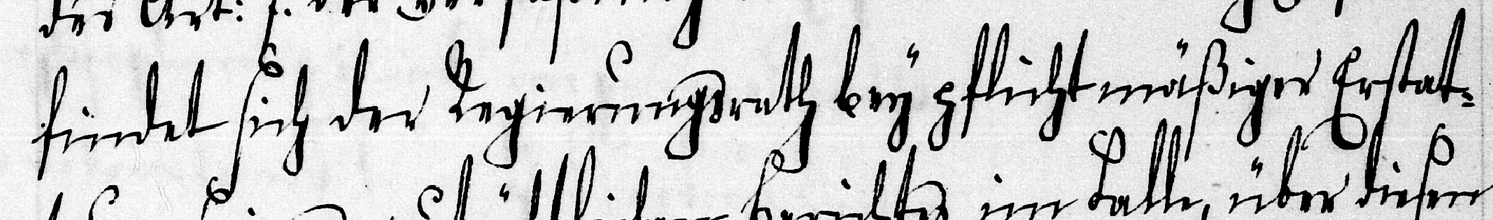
findet sich der Regierungsrath bey pflichtmäßiger Erstat¬
